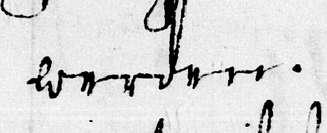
werden.
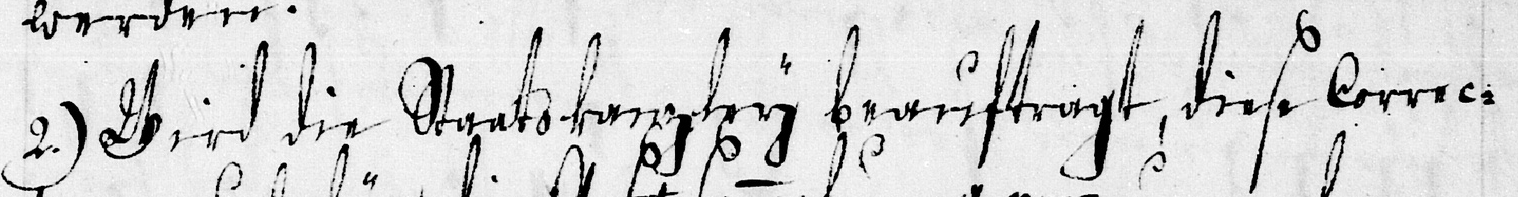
2.) Wird die Staatskanzley beauftragt, diese Corre¬
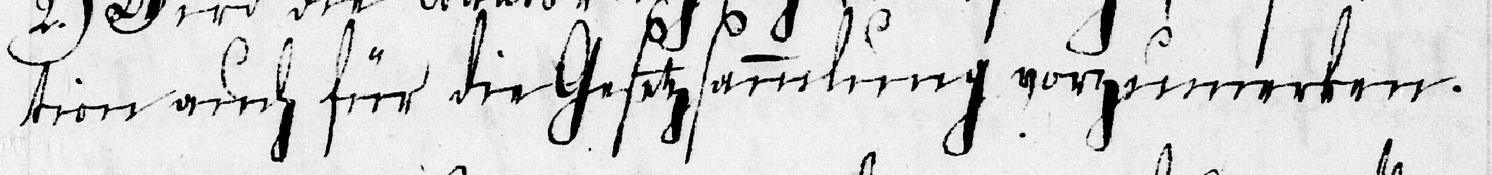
ction auch für die Gesetzsammlung vorzumerken.
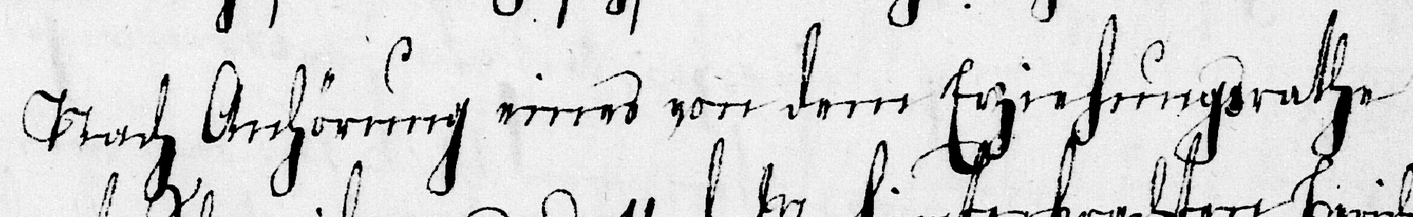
Nach Anhörung eines von dem Erziehungsrathe
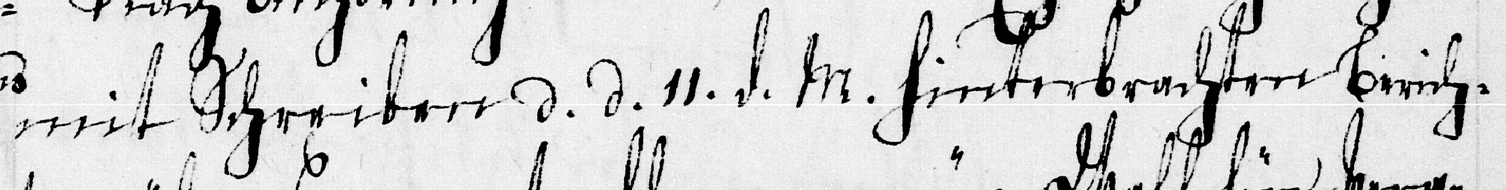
mit Schreiben d. d. 11. d. M. hinterbrachten Berich¬
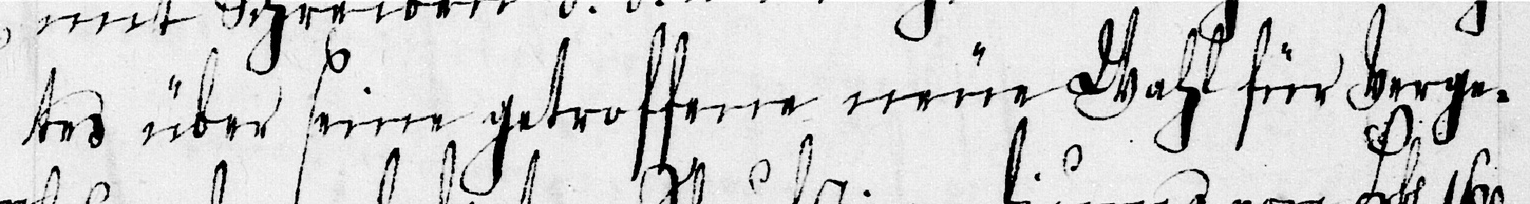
tes über seine getroffene neue Wahl für Verge¬
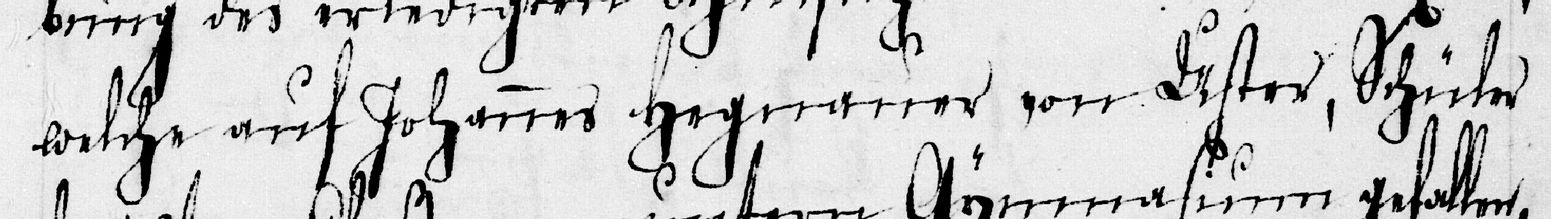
welche auf Johannes Hegnauer von Uster, Schüler
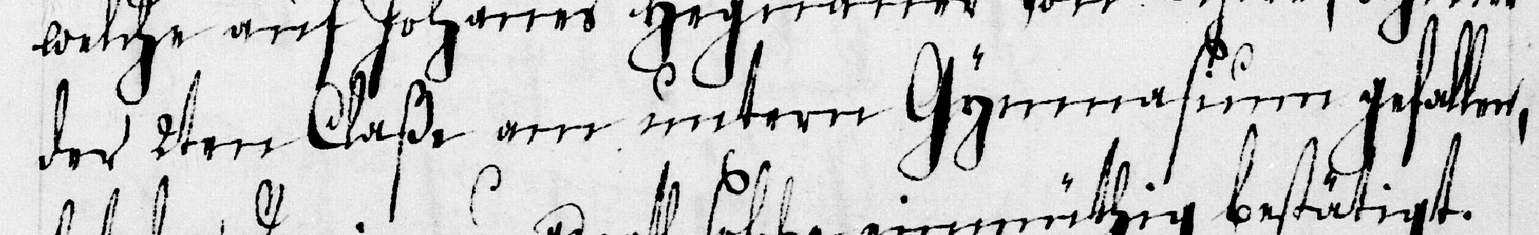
der 2ten Claße am untern Gymnasium gefalle¬
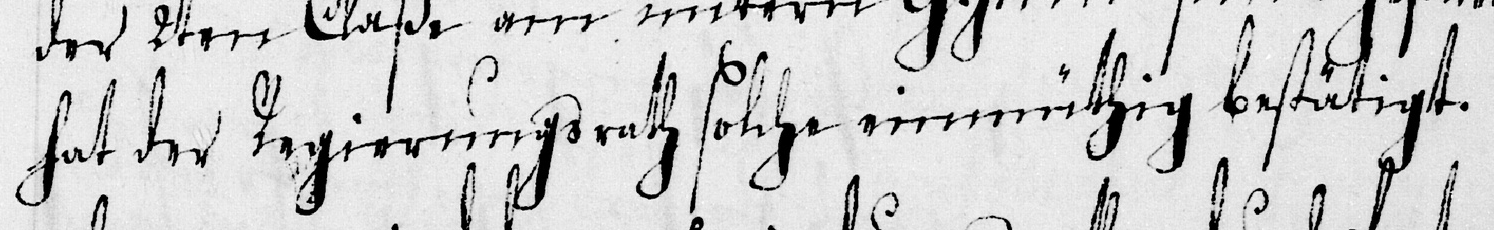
hat der Regierungsrath solche einmüthig bestätigt.
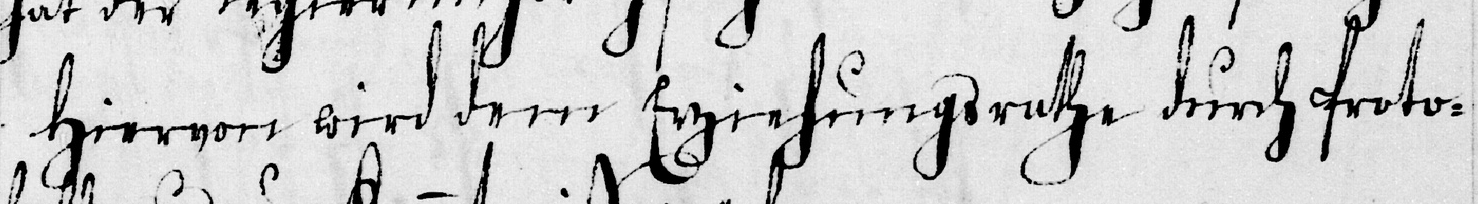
Hiervon wird dem Erziehungsrathe durch Proto¬
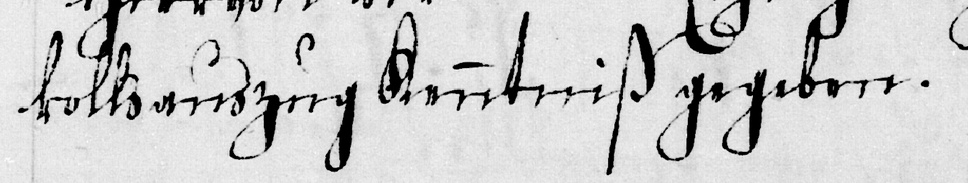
kollsauszug Kenntniß gegeben.
